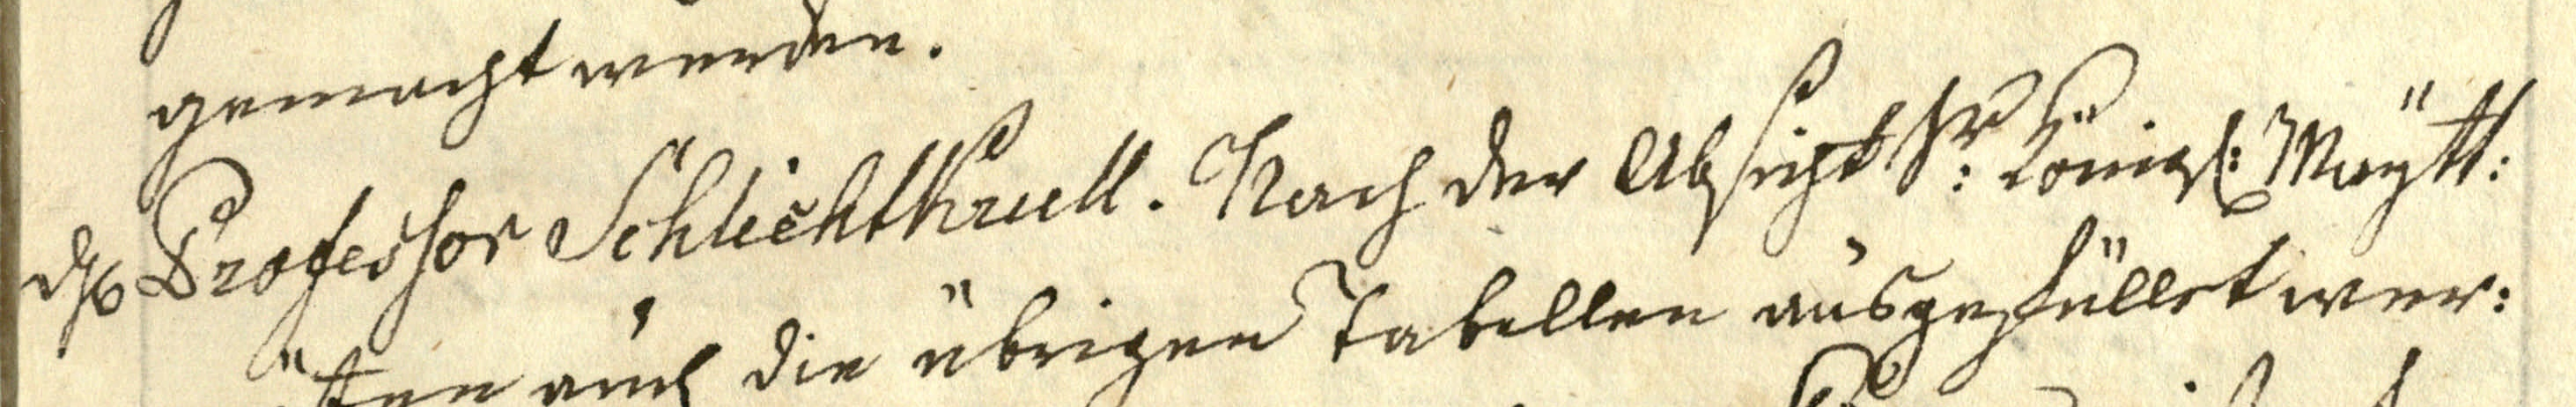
dh Professor Schlichtkrull. Nach der Absicht Sr Königl Maÿtt.
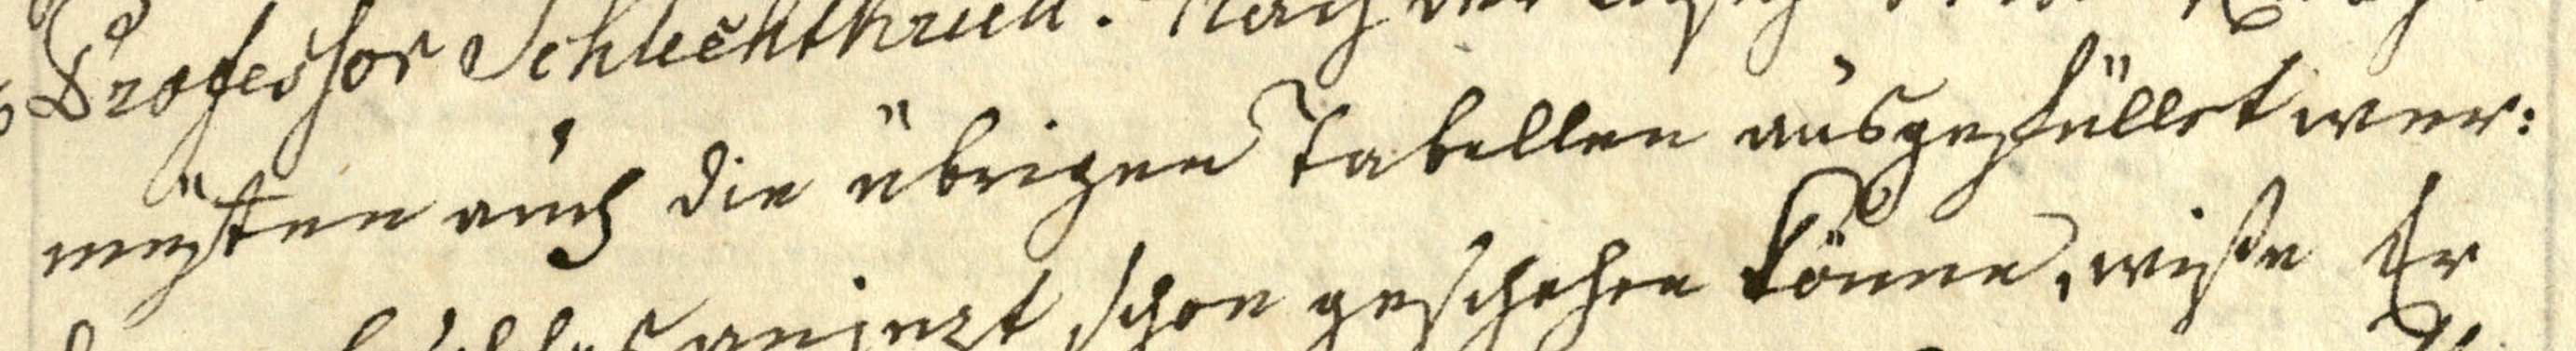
müsten auch die übrigen Tabellen ausgefüllet wer¬
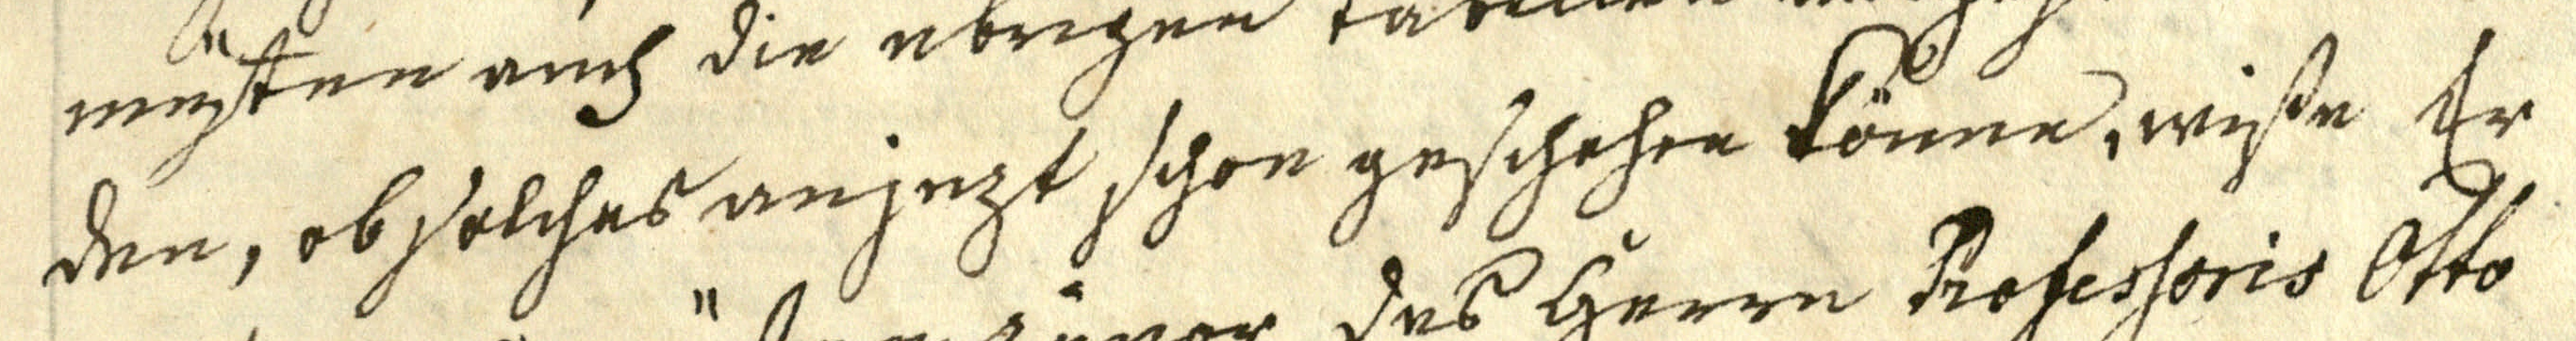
den, ob solches anjezt schon geschehen könne, wiße Er
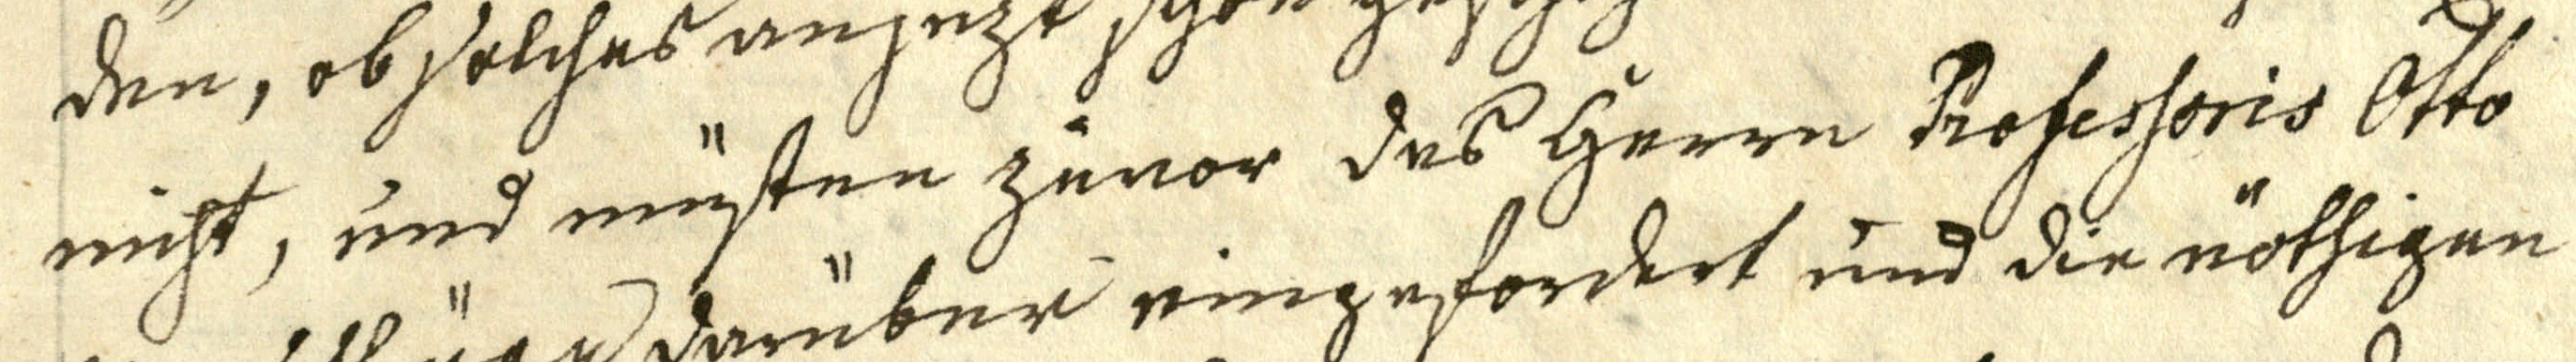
nicht, und müsten zuvor des Herrn Professoris Otto
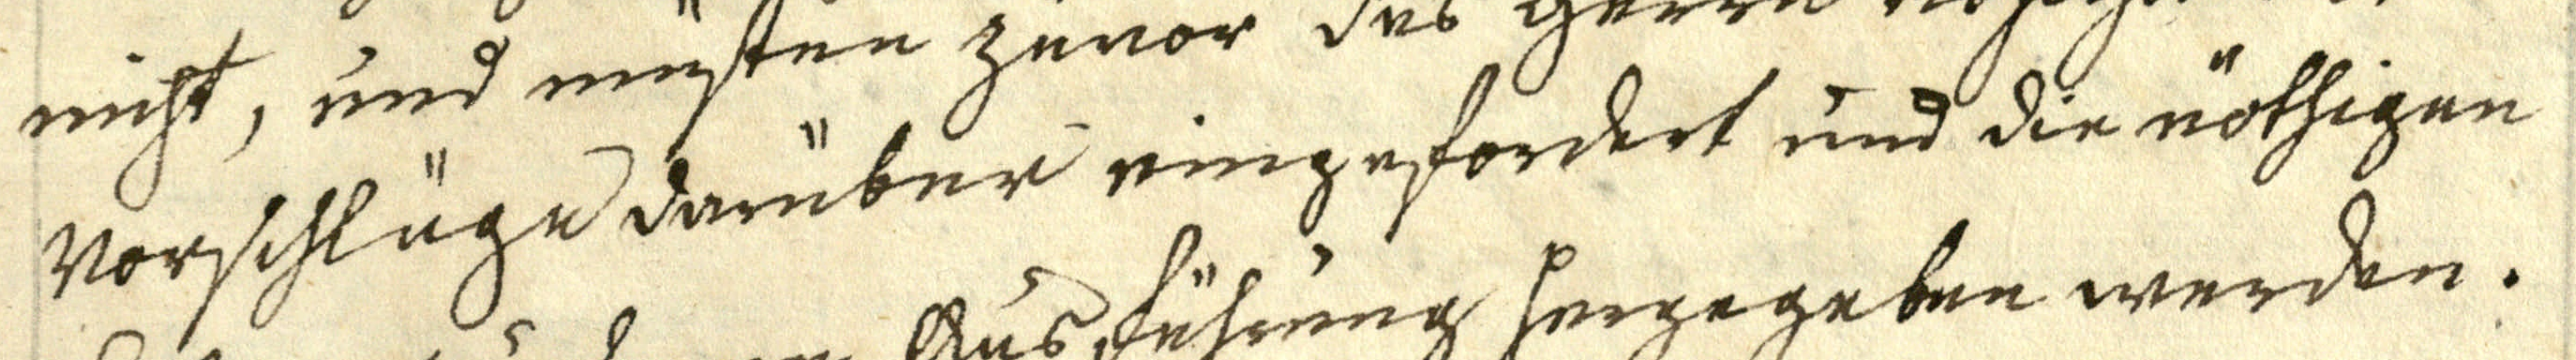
Vorschläge darüber eingefordert und die nöthigen
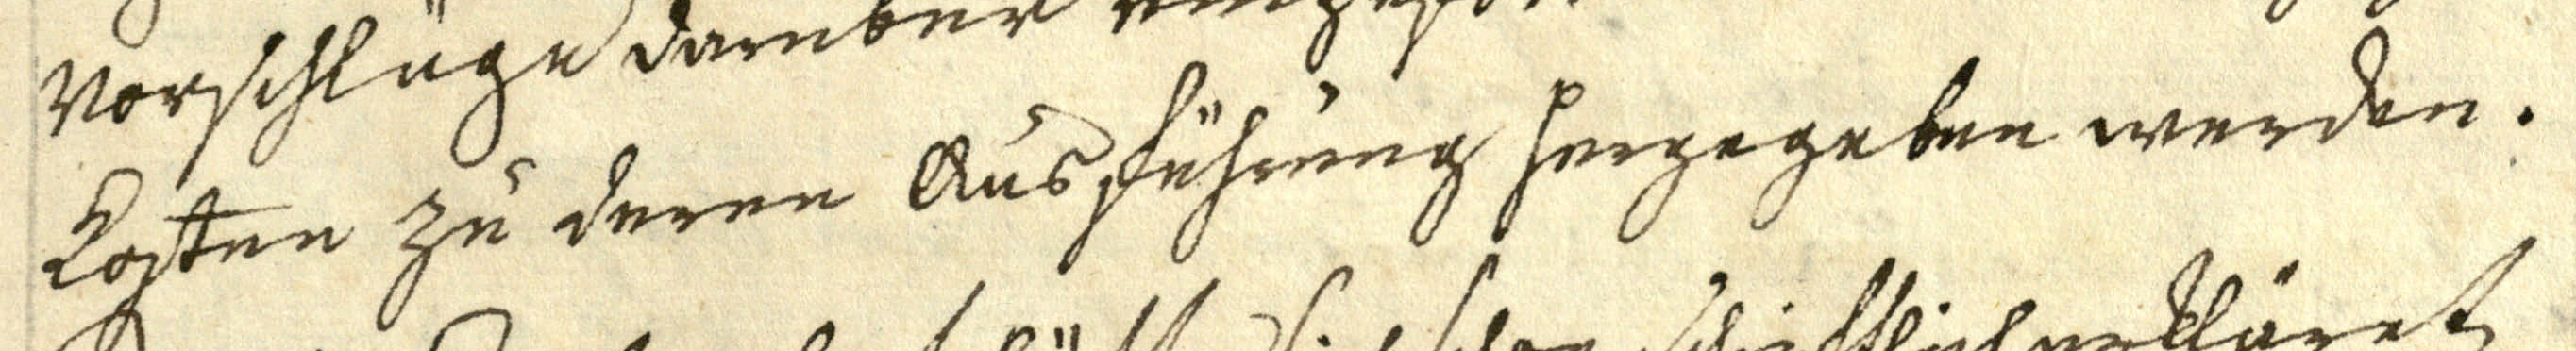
Kosten zu deren Ausführung hergegeben werden.
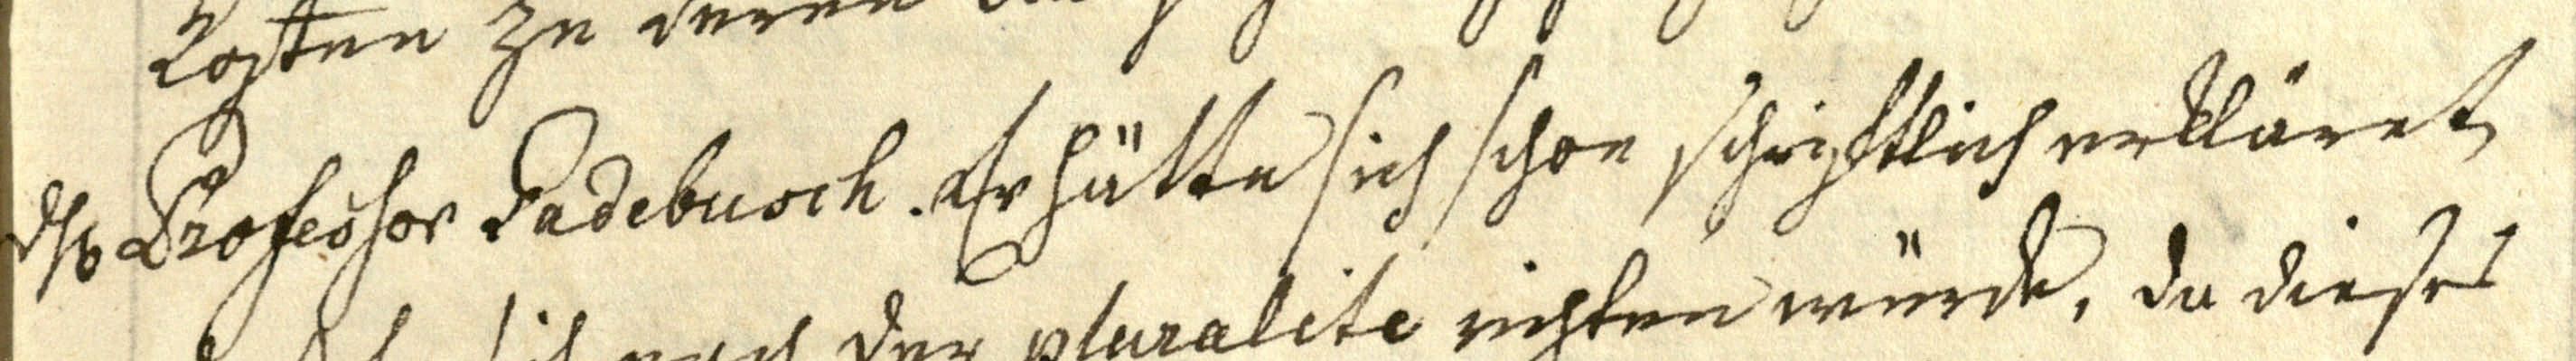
dh Professor Gadebusch. Er hätte sich schon schriftlich erkläret
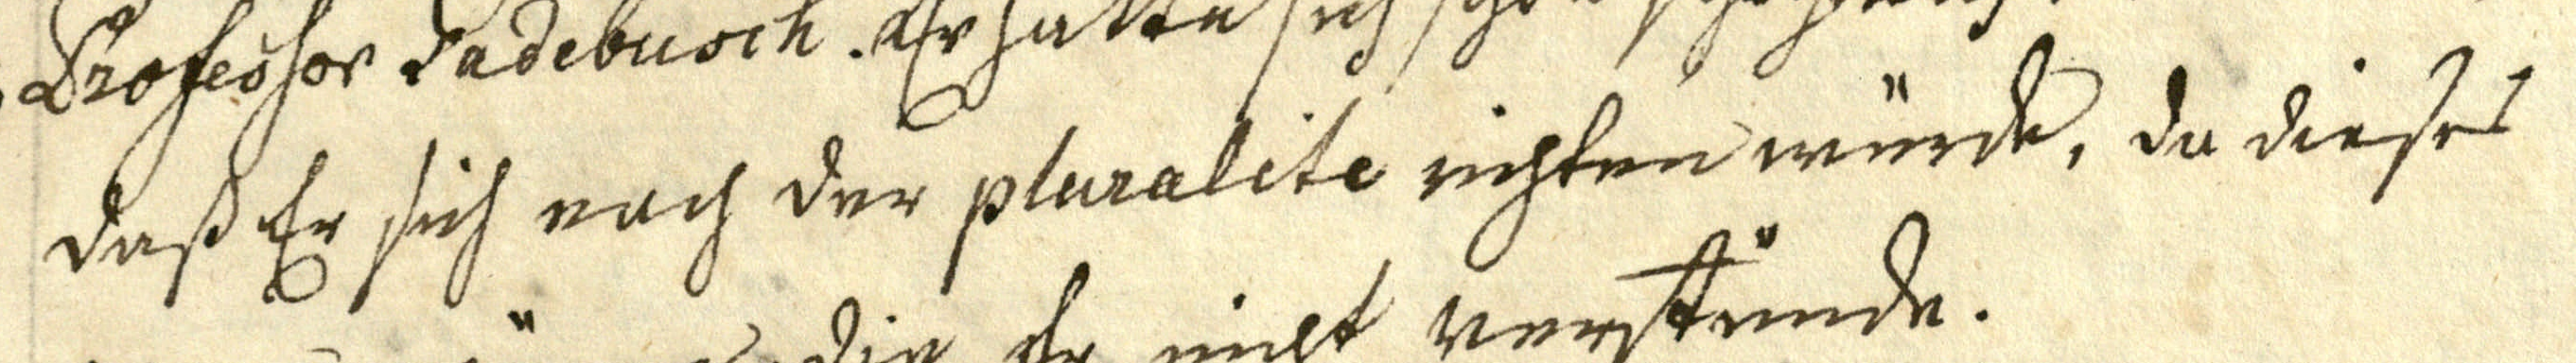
daß Er sich nach der pluralite richten würde, da dieses
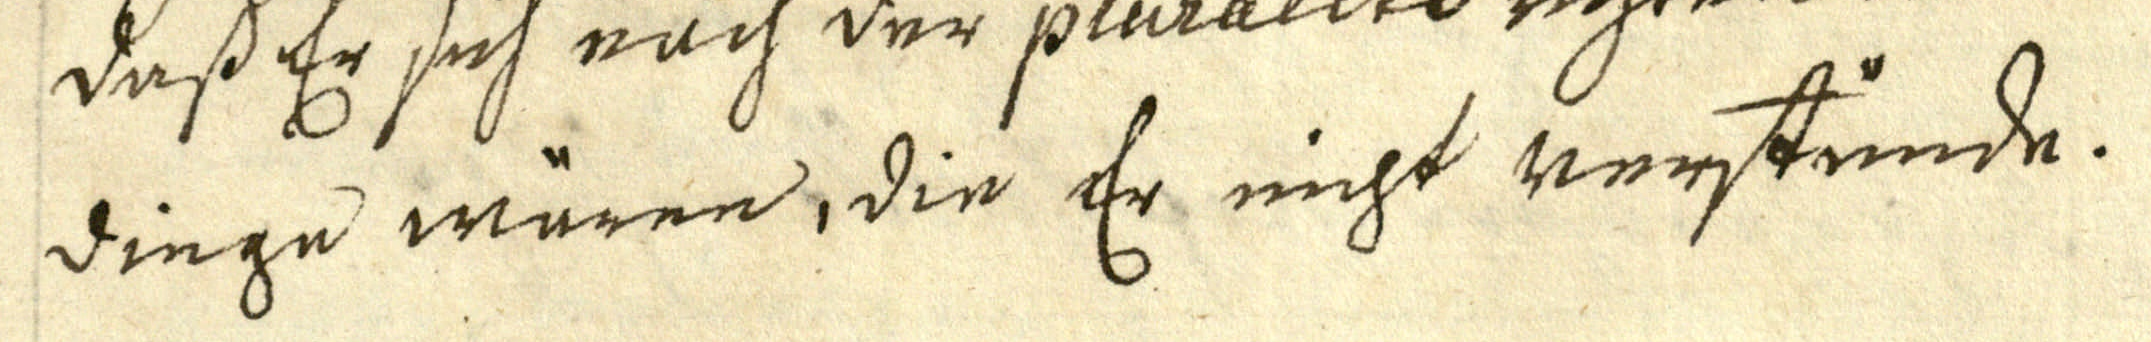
dinge wären, die Er nicht verstünde.
